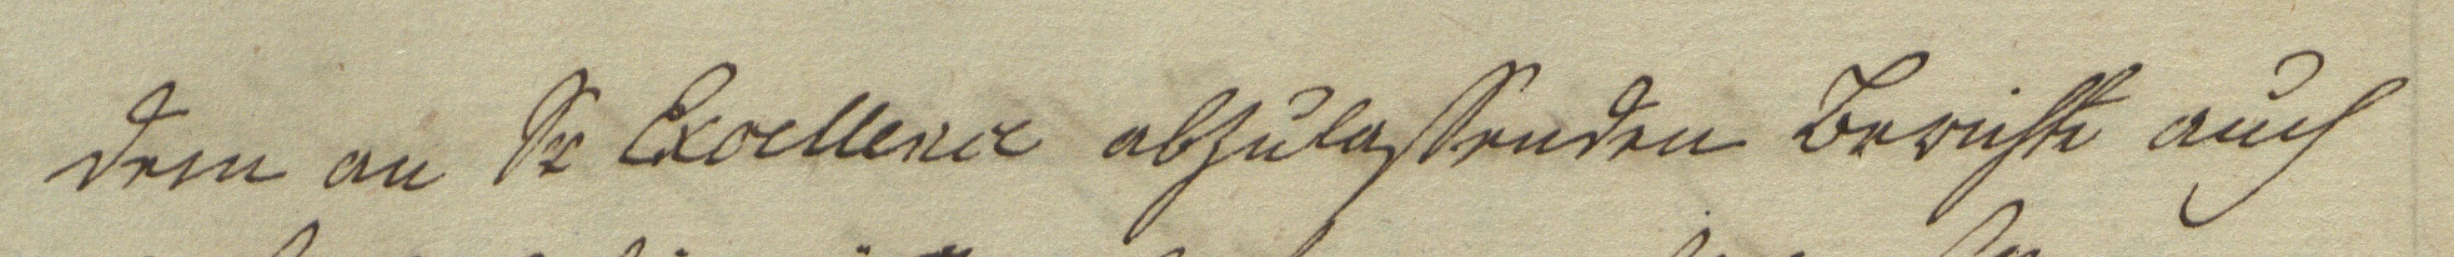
dem an Sr Excellence abzulassenden Berichte auch
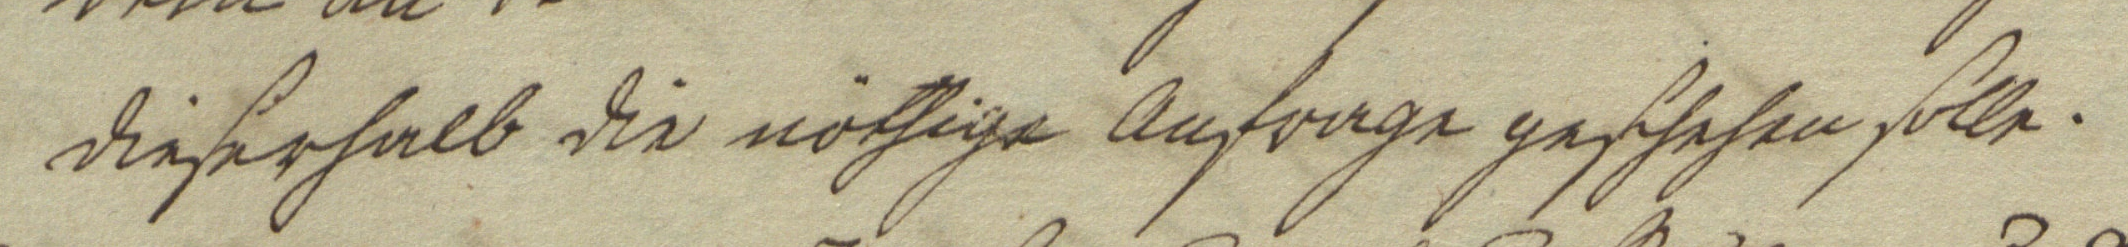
dieserhalb die nöthige Anfrage geschehen solle.
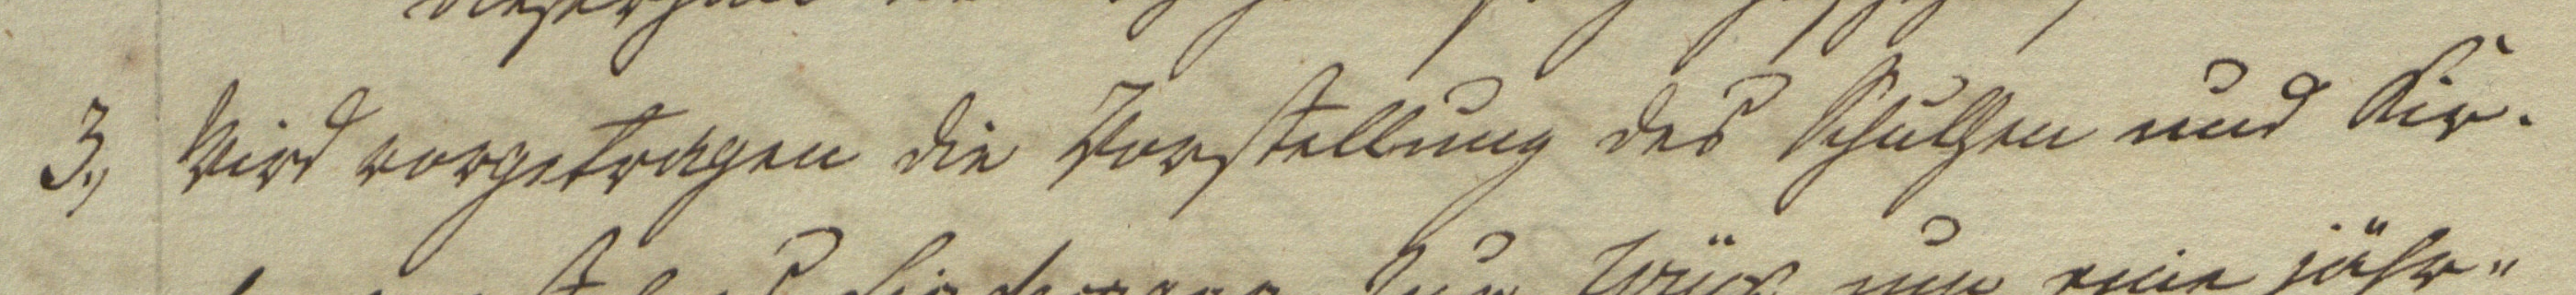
3. Wird vorgetragen die Vorstellung des Schulzen und Kir¬
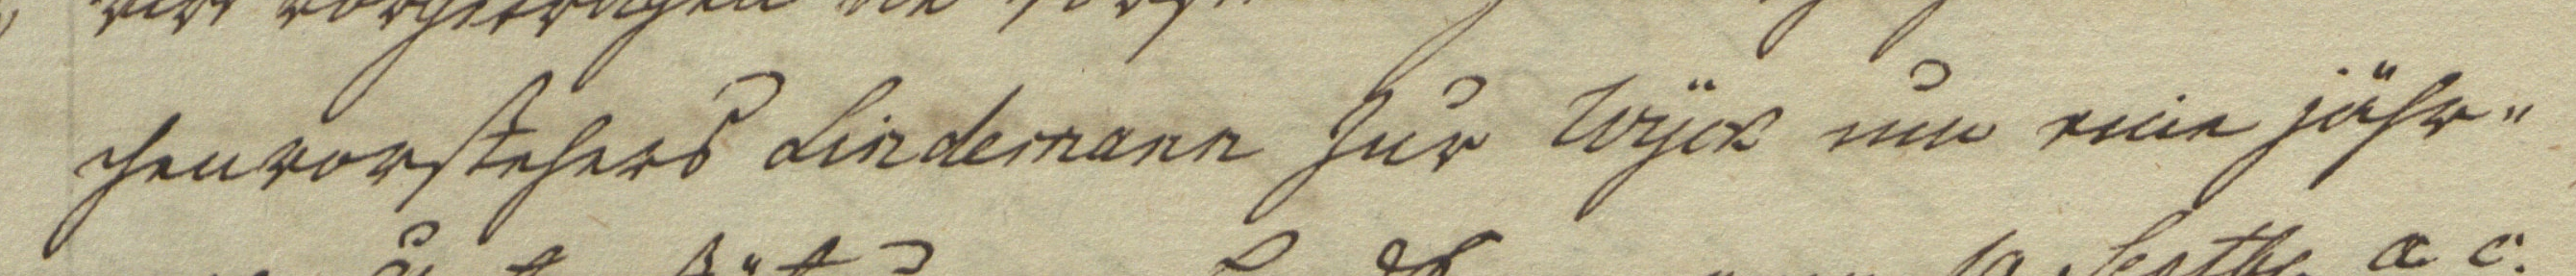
chenvorstehers Lindemann zur Wÿck um eine jähr¬
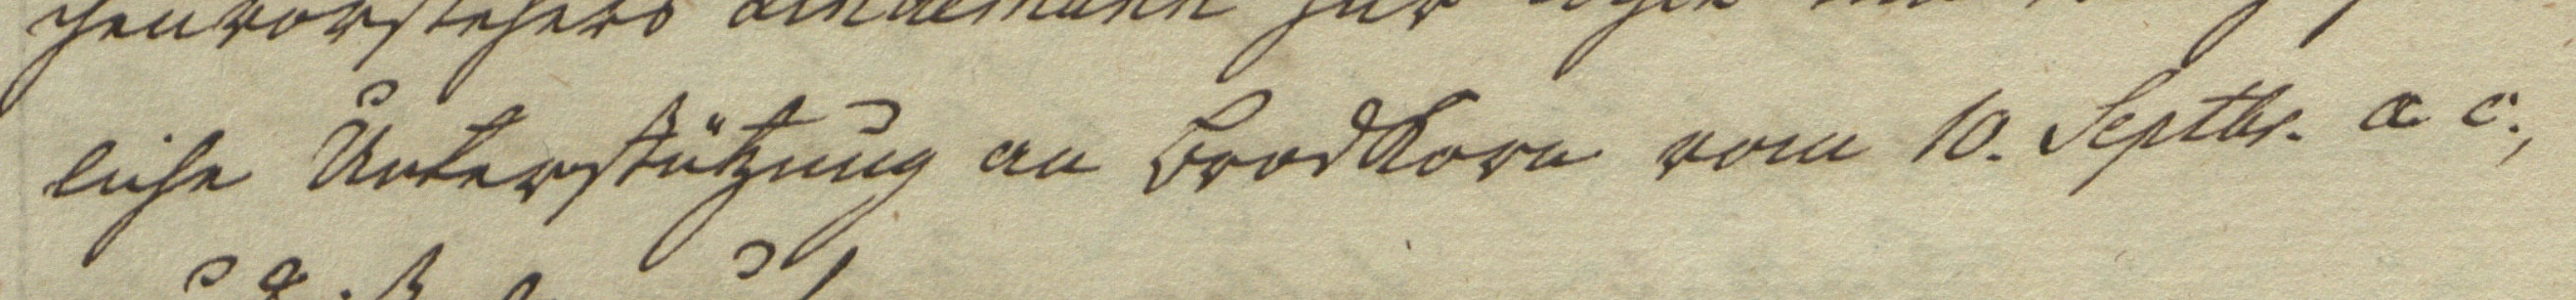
liche Unterstützung an Brodkorn vom 10. Septbr. a. c.
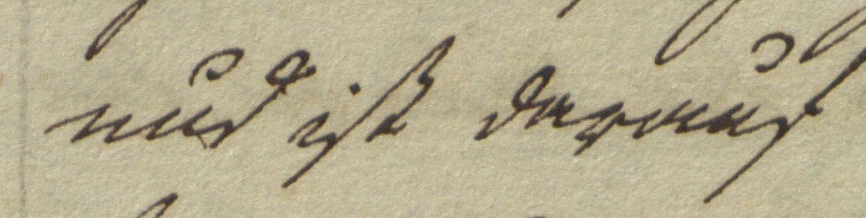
und ist darauf
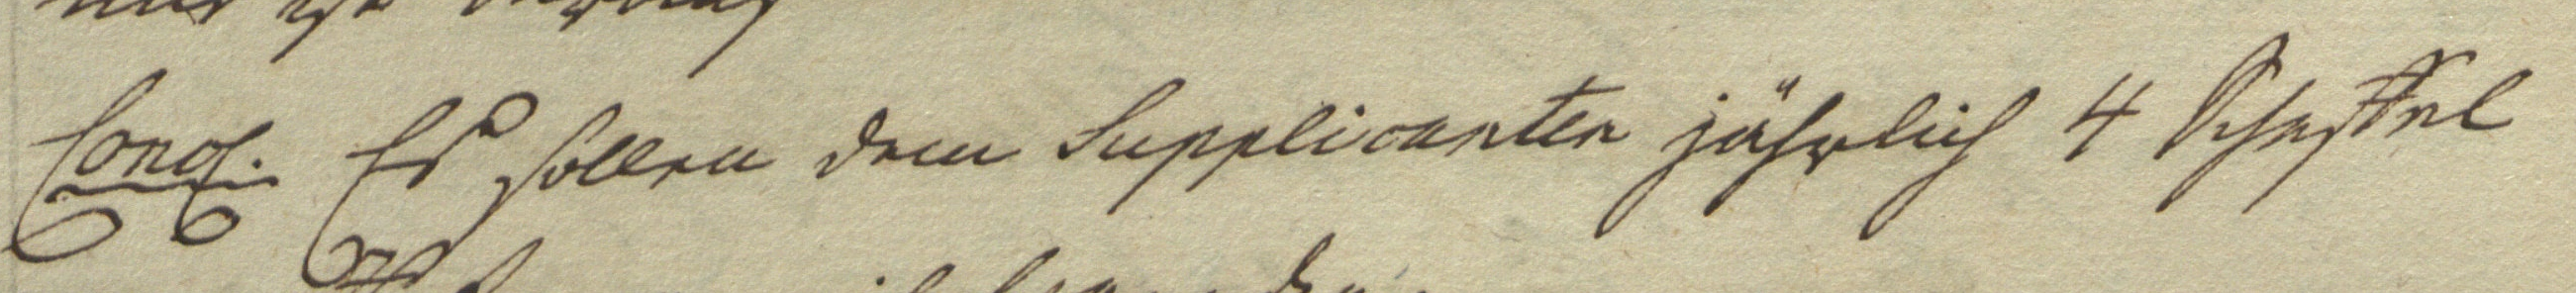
Concl. Es sollen dem Supplicanten jährlich 4 Scheffel
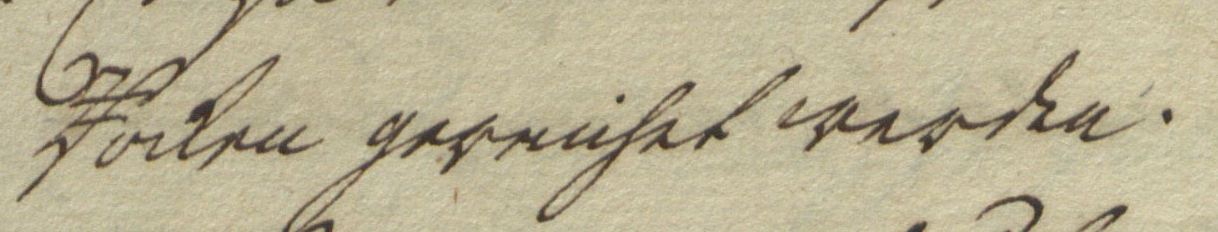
Rocken gereichet werden.
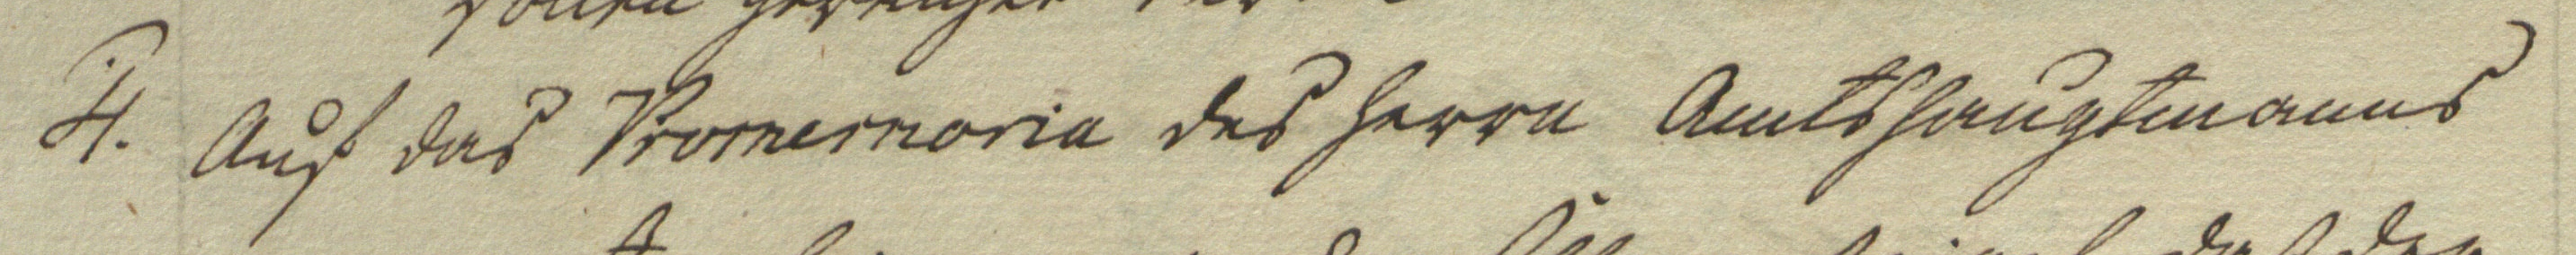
4. Auf das Promemoria des Herrn Amtshauptmanns
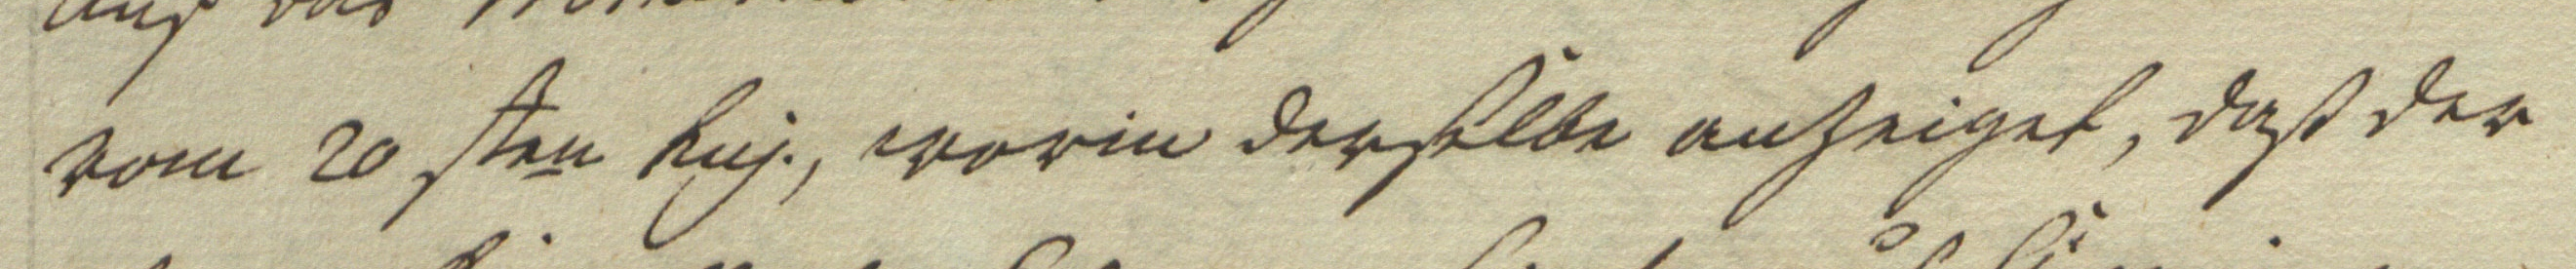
vom 20 sten huj., worin derselbe anzeiget, daß der
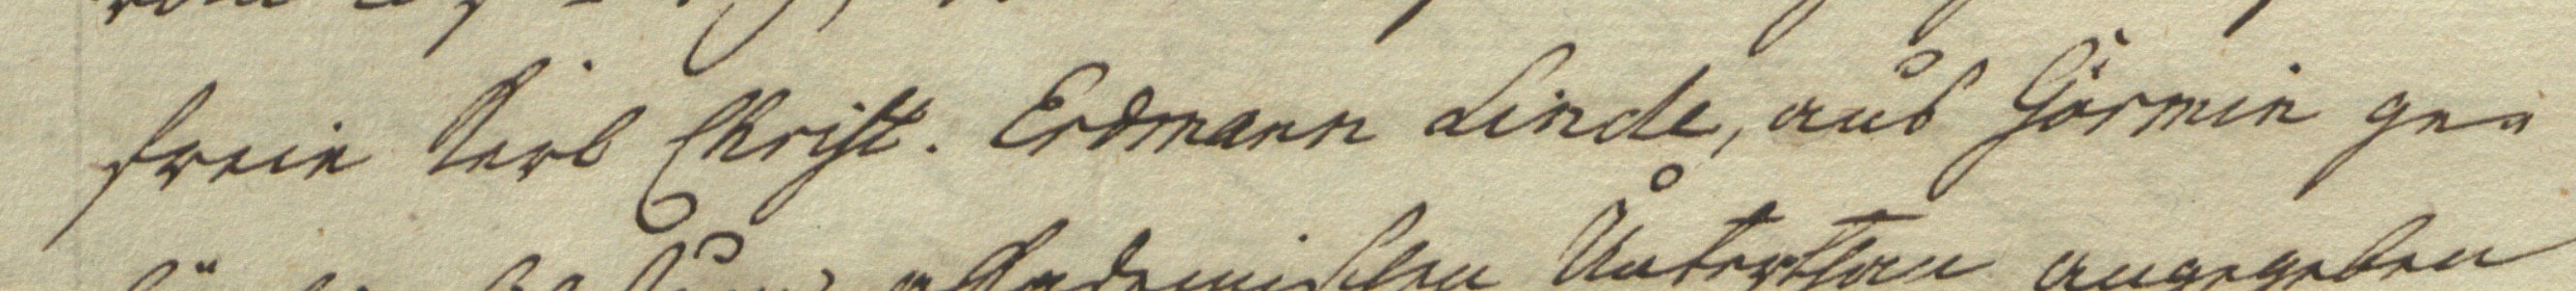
freie er Kerl Christ. Erdmann Linde, aus Görmin ge¬
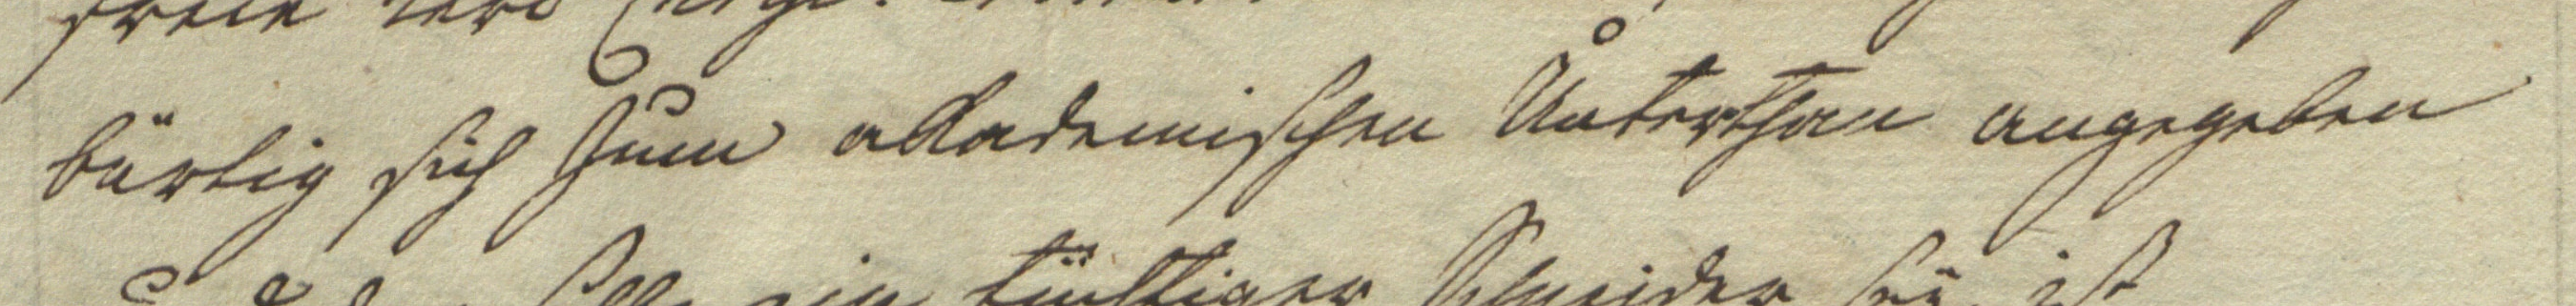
bürtig sich zum akademischen Unterthan angegeben
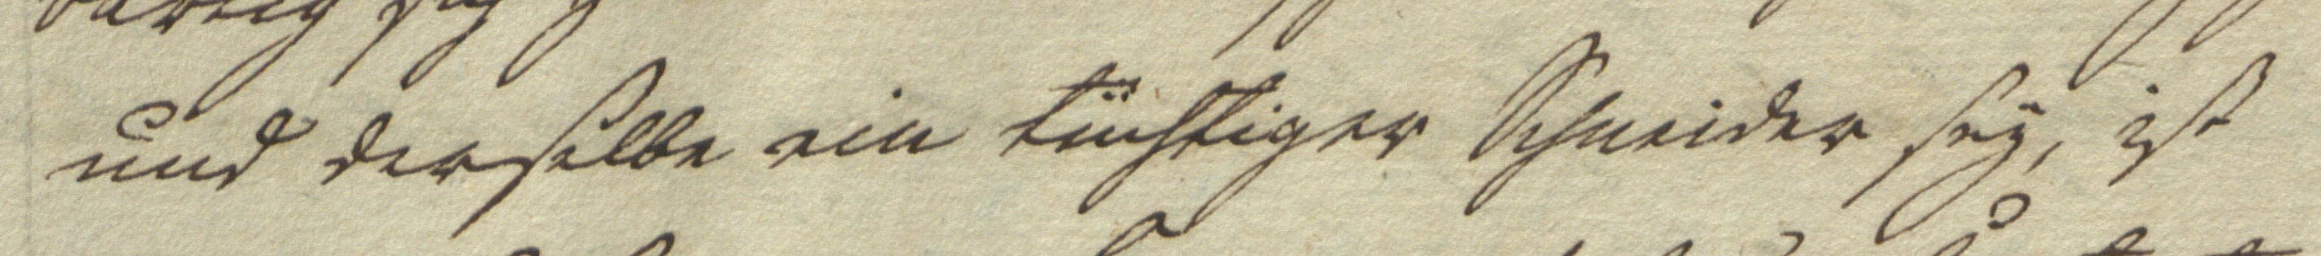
und derselbe ein tüchtiger Schneider seÿ, ist
